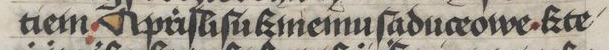tiemi.A pṙiẛli ſu knemu ſaduceowé.kte¬
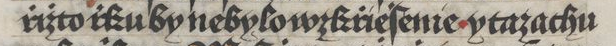ṙiżto ṙku by nebylo vzkṙíeẛenie.y tazachu
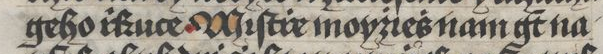geho ṙkuce.Miſtṙe moyzíeṡ nam ḡt na¬
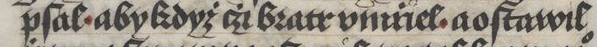pſal.aby kdyż cżi bzatr vmṙiel.a oſtawil
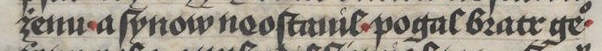żenu.a ſynow no oſtauil.pogal bratr geo
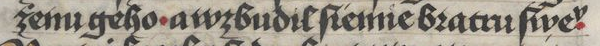żenu geho.a wzbudil ſiemie bratru ſwev
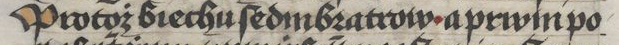Protoż bíechu ſedm bratrow.a prwní po¬
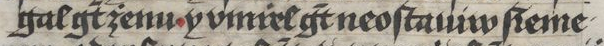gal ḡt żenu.y vmṙel ḡt neoſtauiw ſíeme
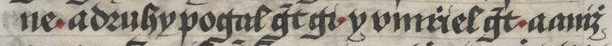ne.adruhy pogal ḡt gi y umṙiel ḡt.a aniż
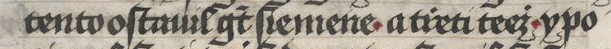tento oſtauil ḡt ſemene.a tṙeti teež.y po¬
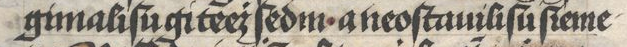gimaliſu gi teež ſedm.a neoſtauiliſu ſieme
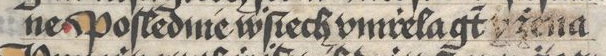ne.Poſlednie wẛiech umṙela ḡt?K ak
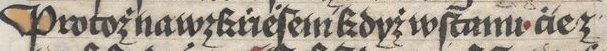Protož na wzkṙíeẛení když wſtanu.ċíe z
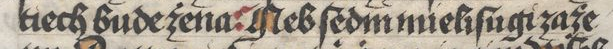tiech bude żena?Neb ſedm mieli ſu gi zaże¬
